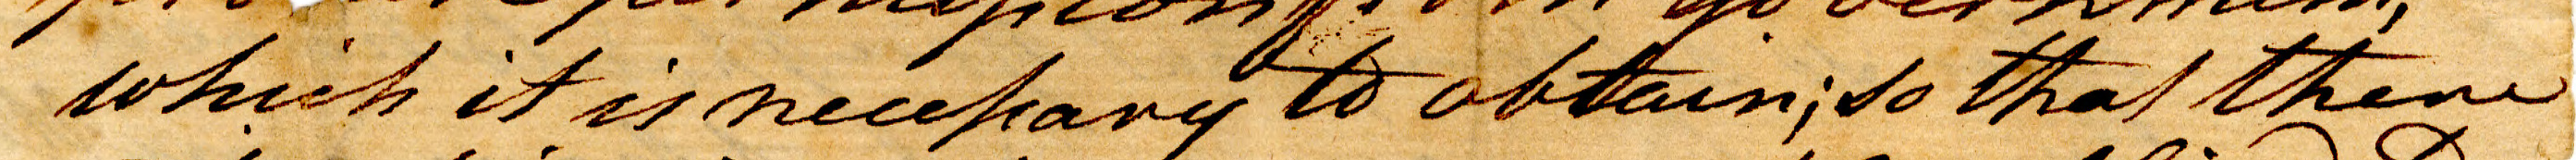which it is necessary to obtain; so that there
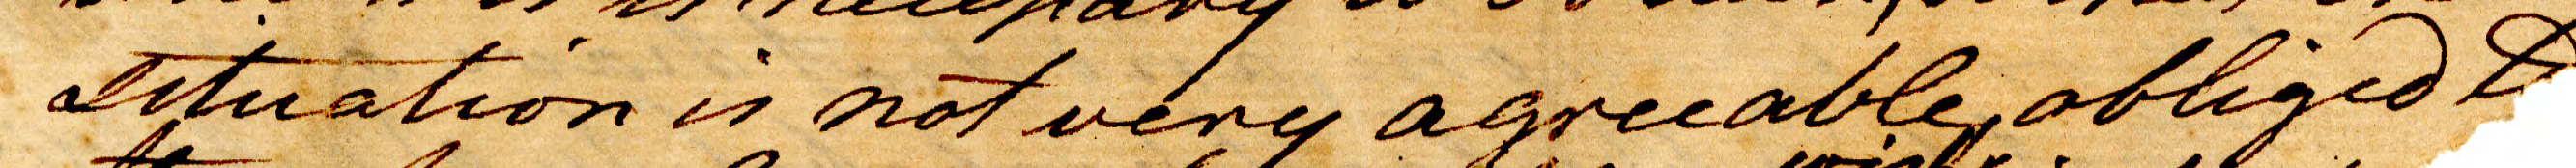situation is not very agreeable, obliged to
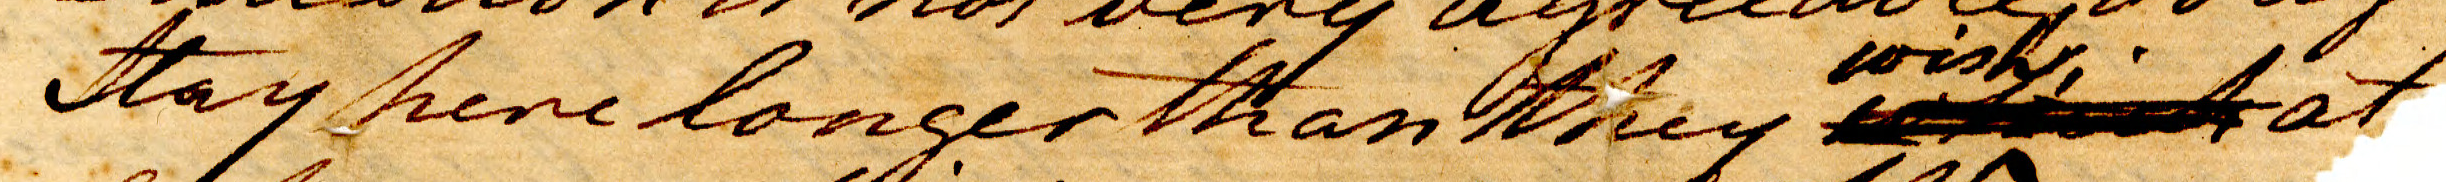stay here longer than they ^ [which] at
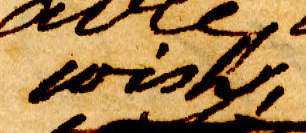wish,
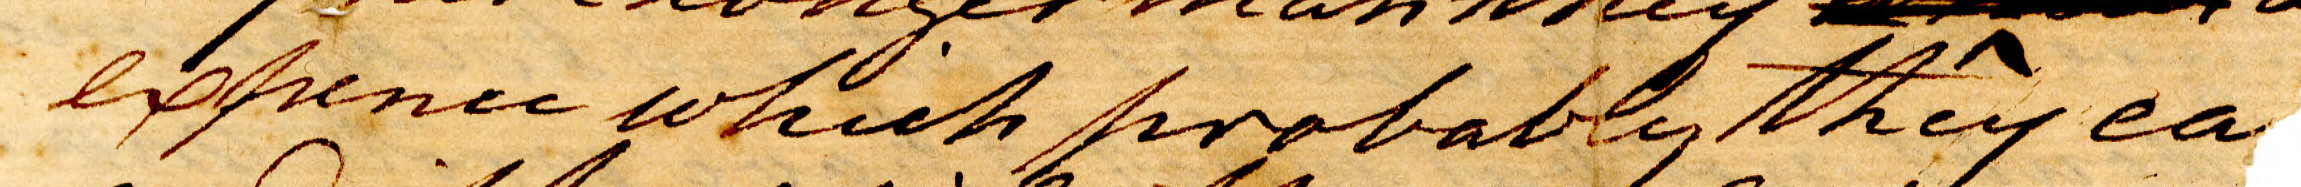expence which probably they ca
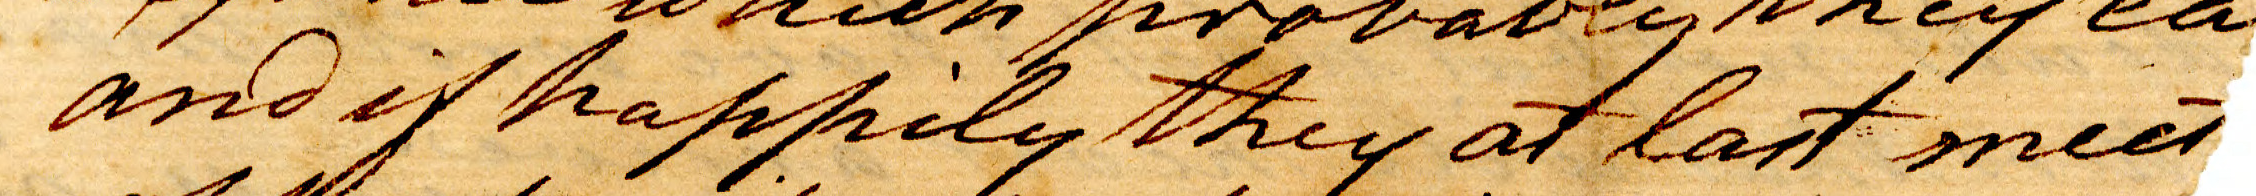and if happily they at last mee
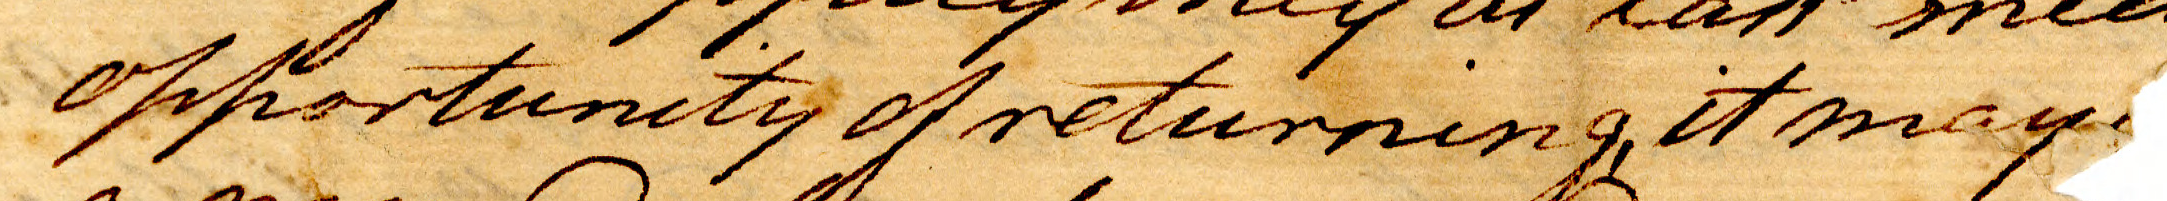opportunity of returning, it may
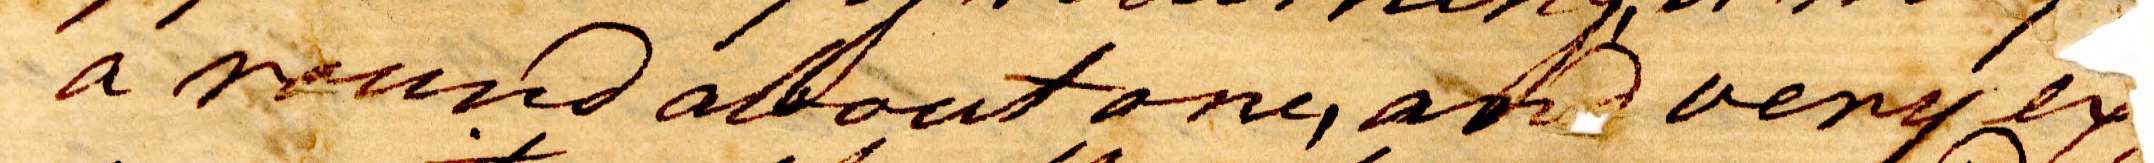a round about one, and very ex
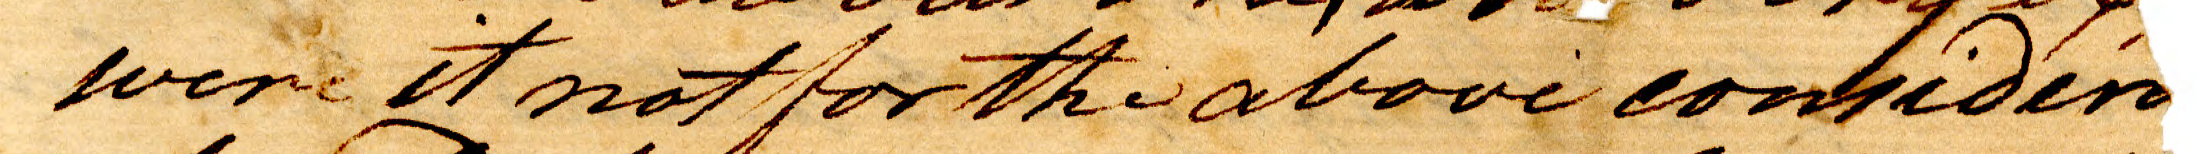were it not for the above consider
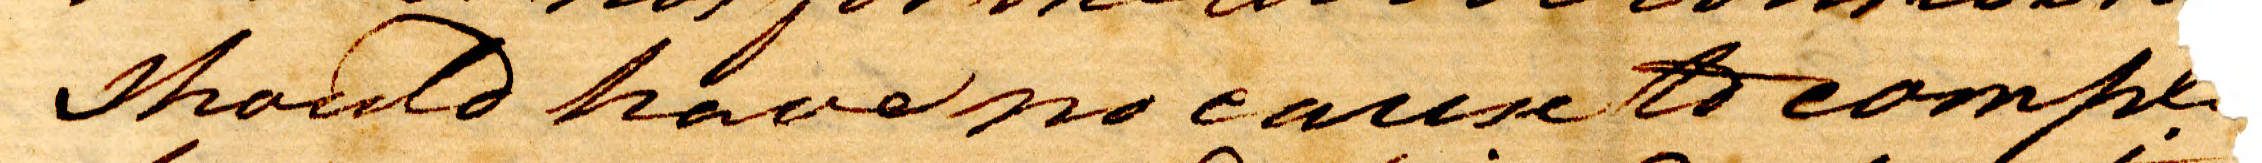should have no cause to compl
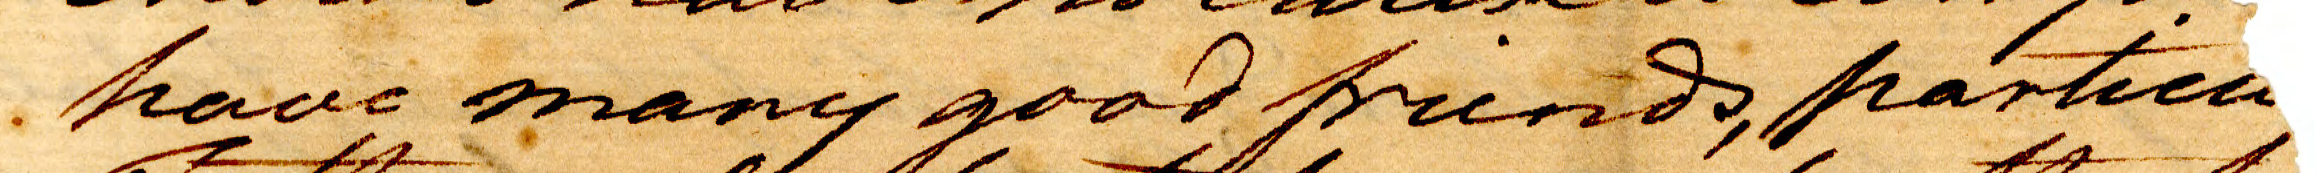have many good friends, particu
